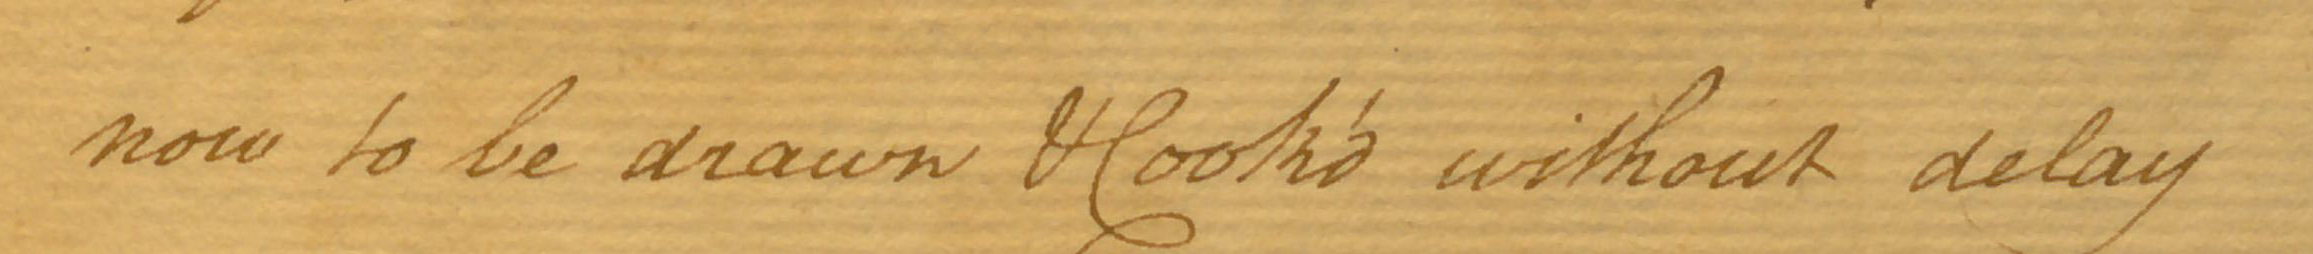now to be drawn & Cook'd without delay
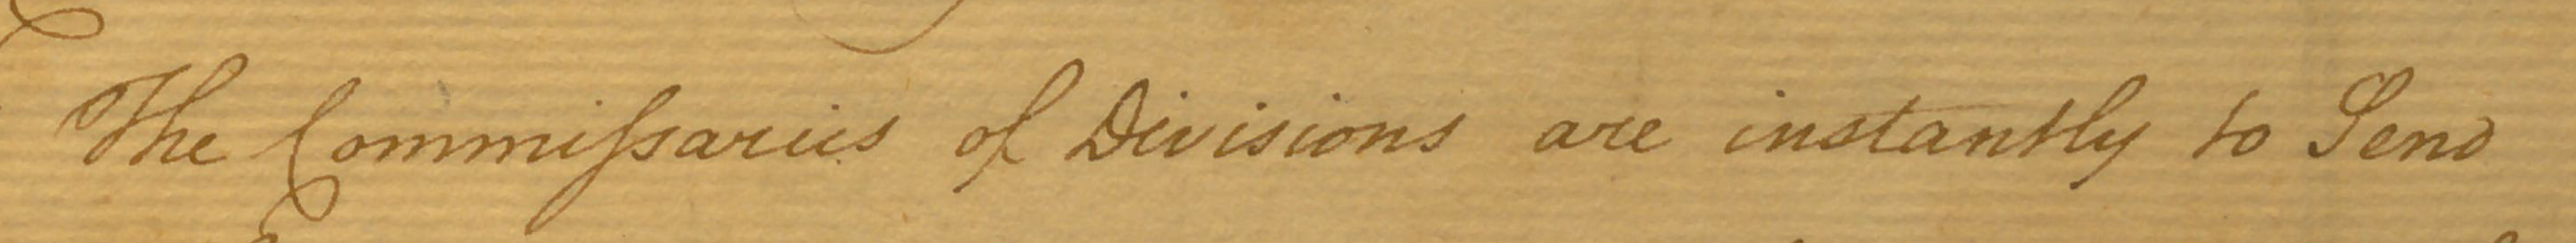The Commissaries of Divisions are instantly to Send
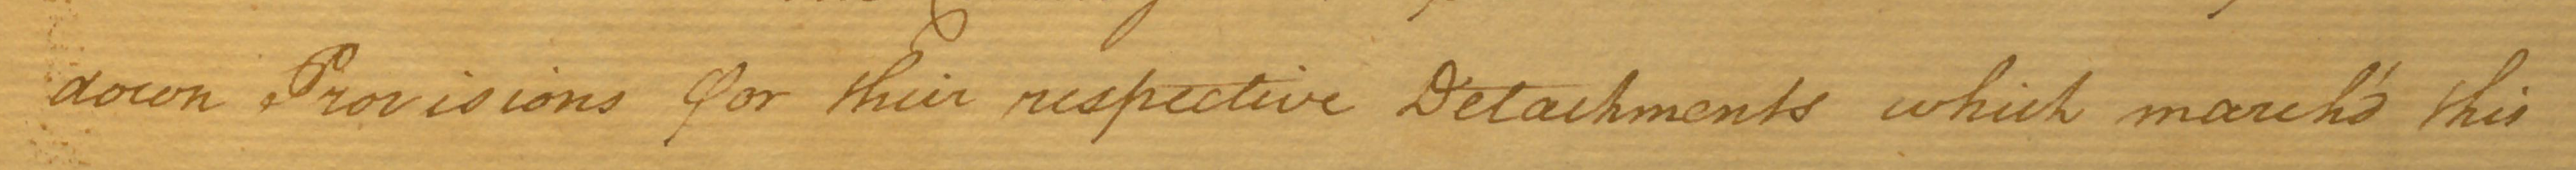down Provisions for their respective Detachments which march'd this
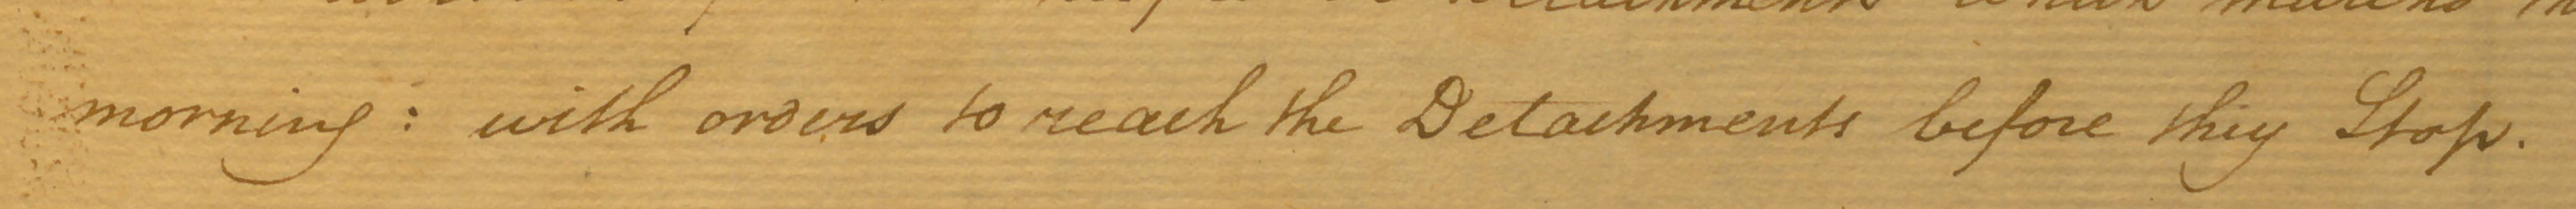morning: with orders to reach the Detachments before they Stop.
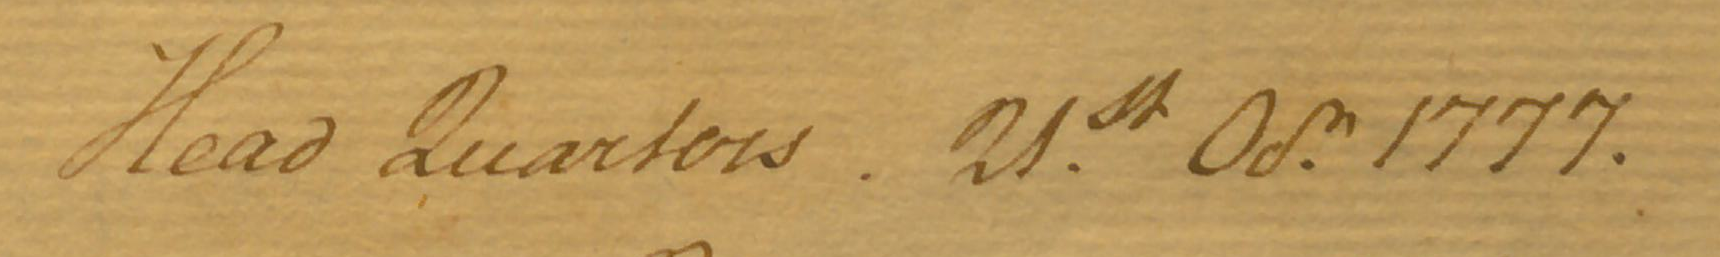Head Quarters. 21^st. Oc^r. 1777.
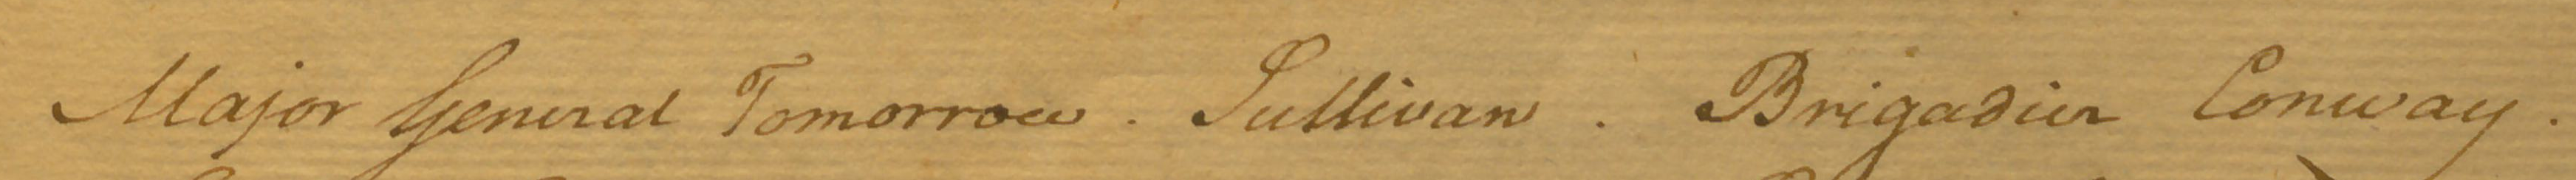Major General Tomorrow. Sullivan. Brigadier Conway.
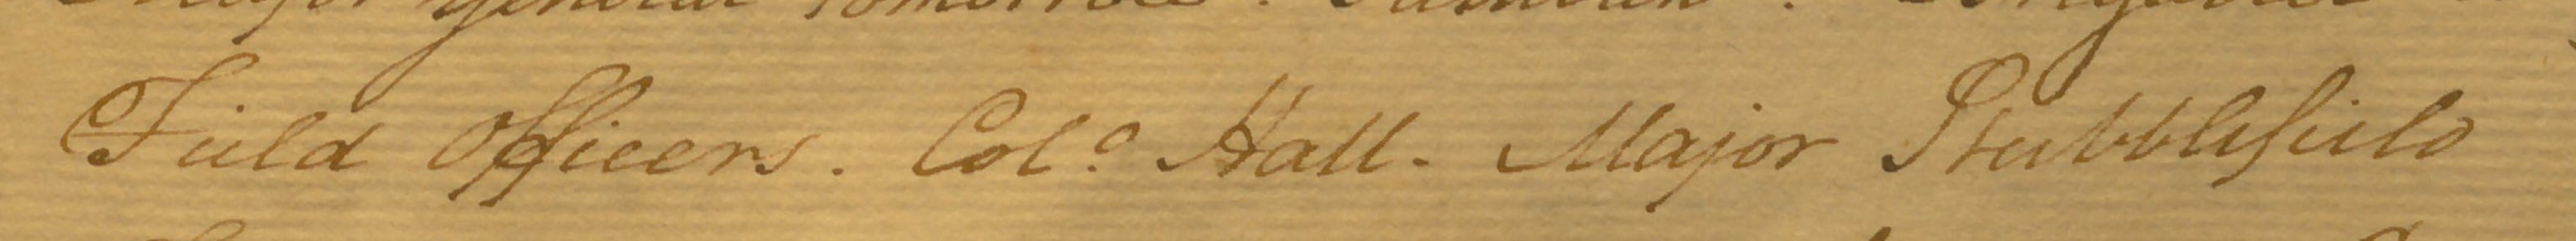Field Officers. Col^o. Hall. Major Stubblefield
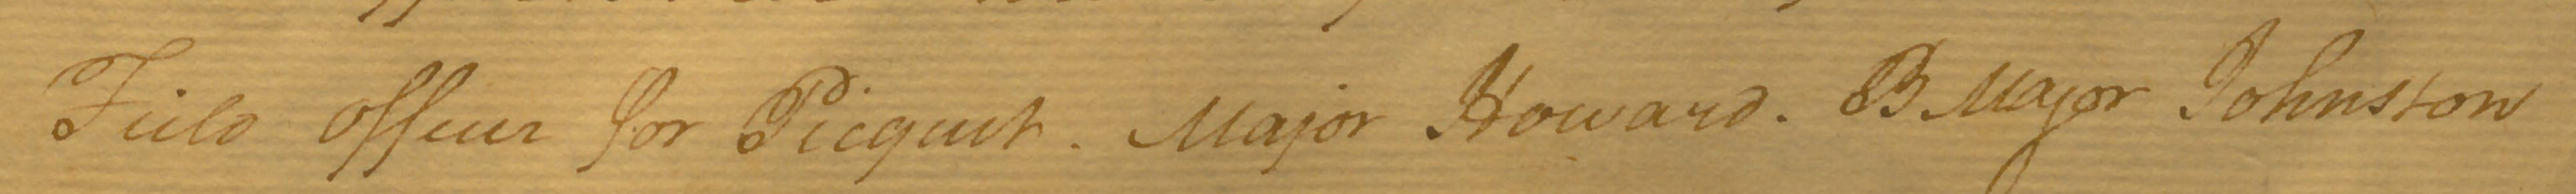Field officer for Picquet. Major Howard. B Major Johnston
